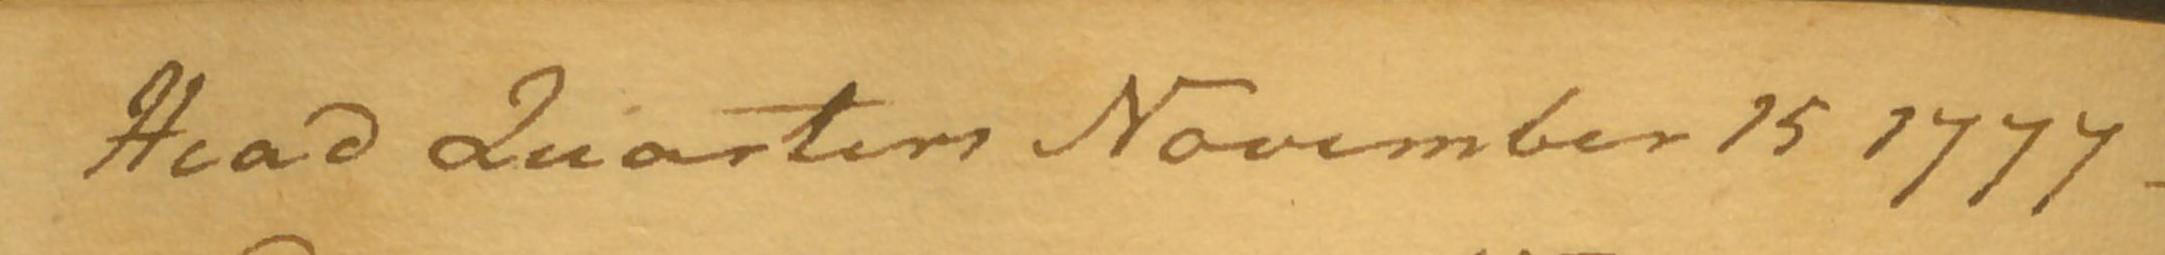Head Quarters November 15 1777
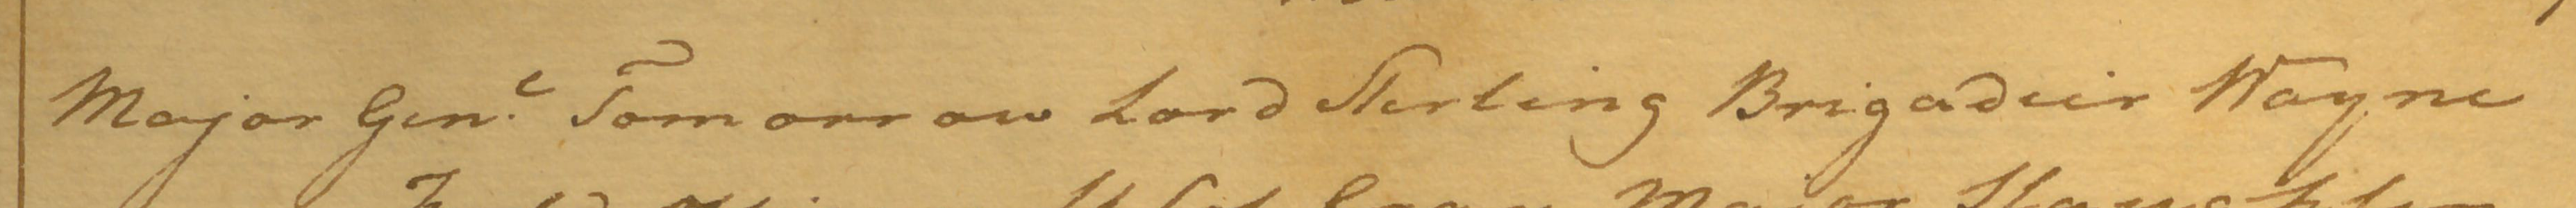Major Gen^l. Tomorrow Lord Sterling Brigadier Wayne
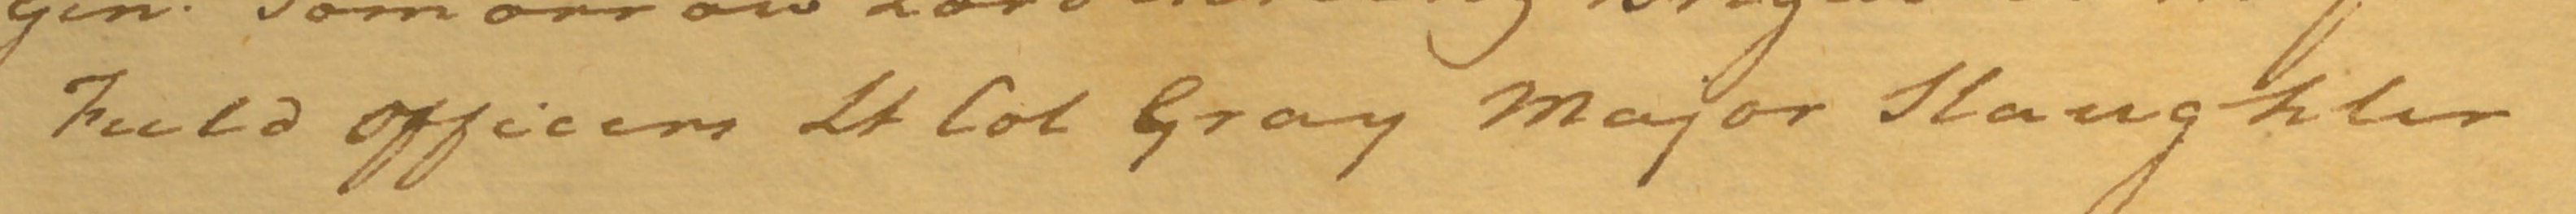Fieldfficers Lt Col Gray Major Slaughter
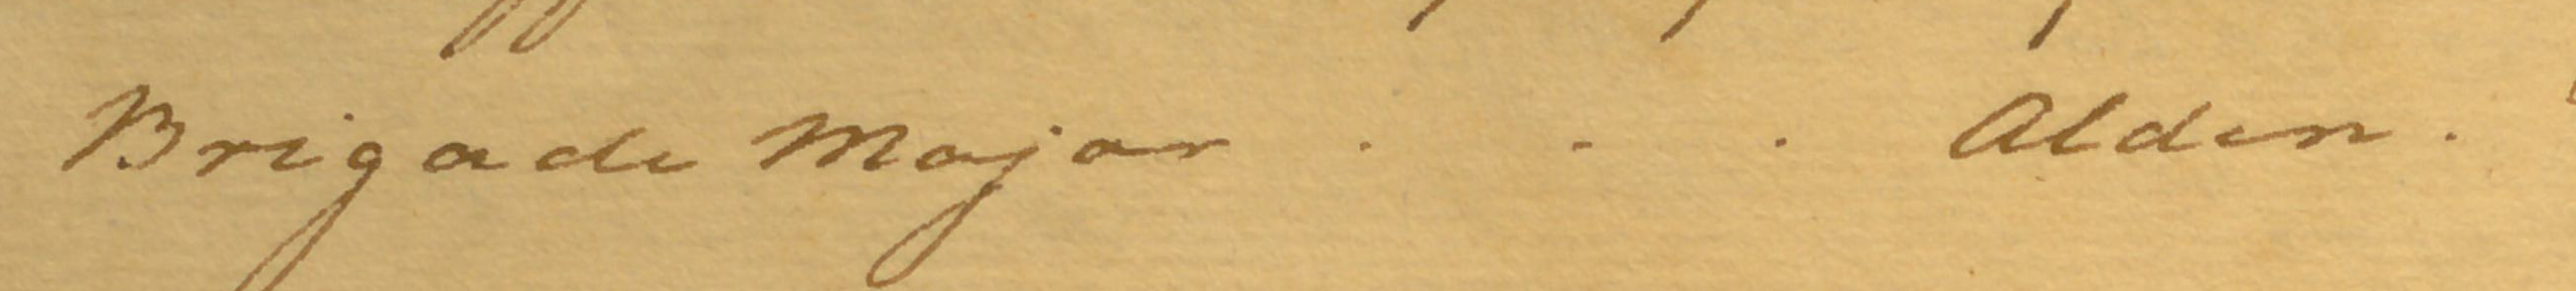Brigade Major ... Alden.
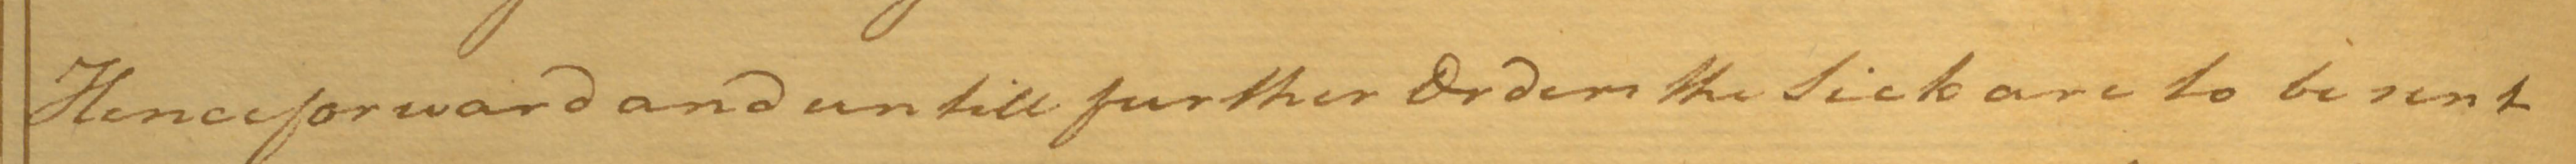Henceforward and untill furhter Orders the Sick are to be sent
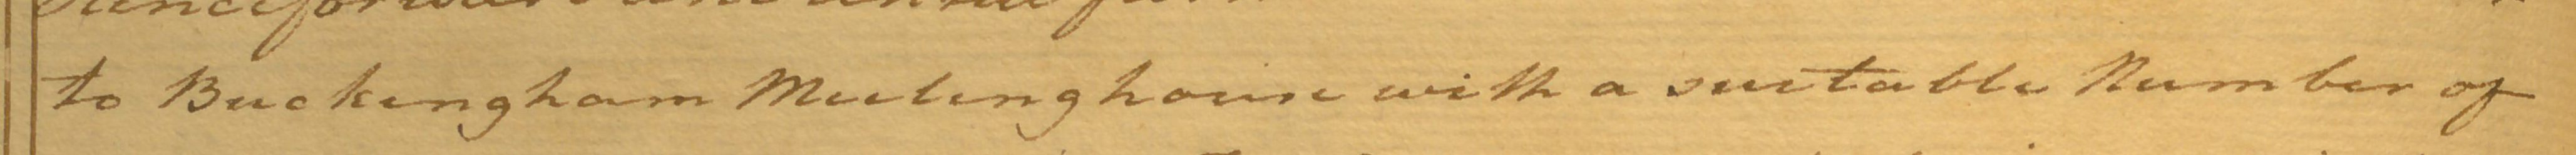to Buckingham Meetinghouse with a suitable Number of
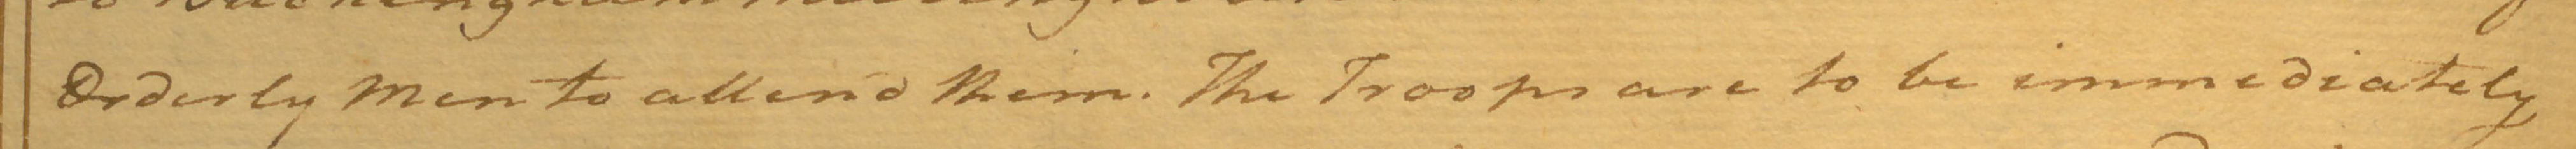Orderly Men to attend them. The Troops are to be immediately
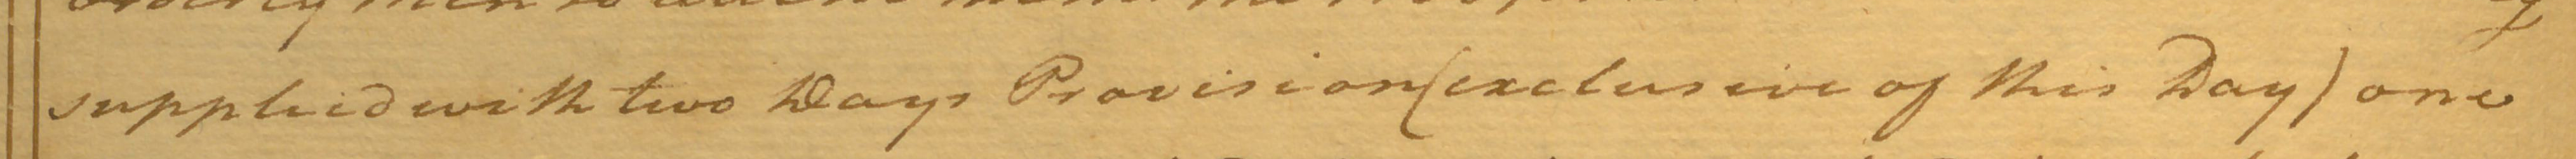supplied with two Days Provisions (exclusive of this Day) one
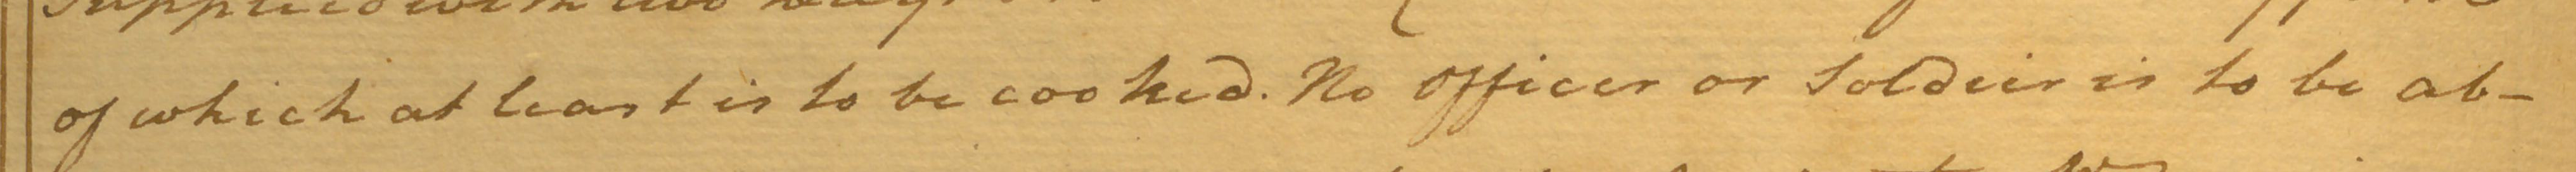of which at least is to be cooked. No officer or Soldier is to be ab-
